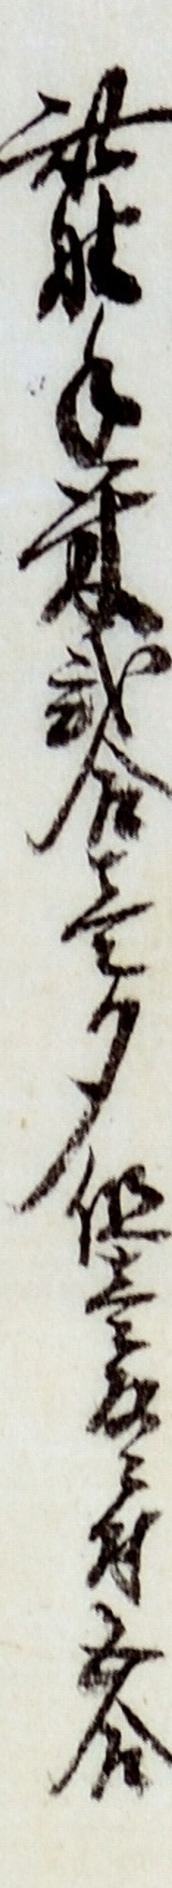此野手米弐合壱勺但壱反ニ付五合
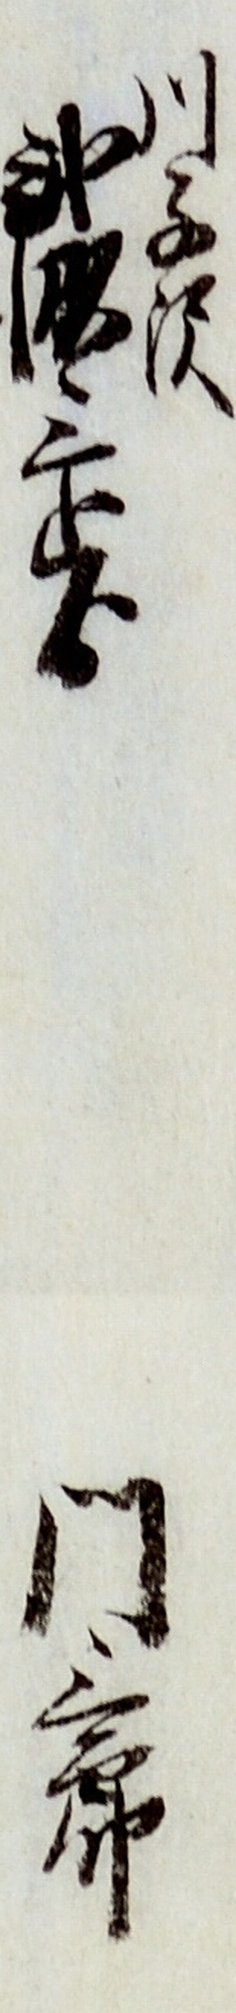弐畝三歩門三郎
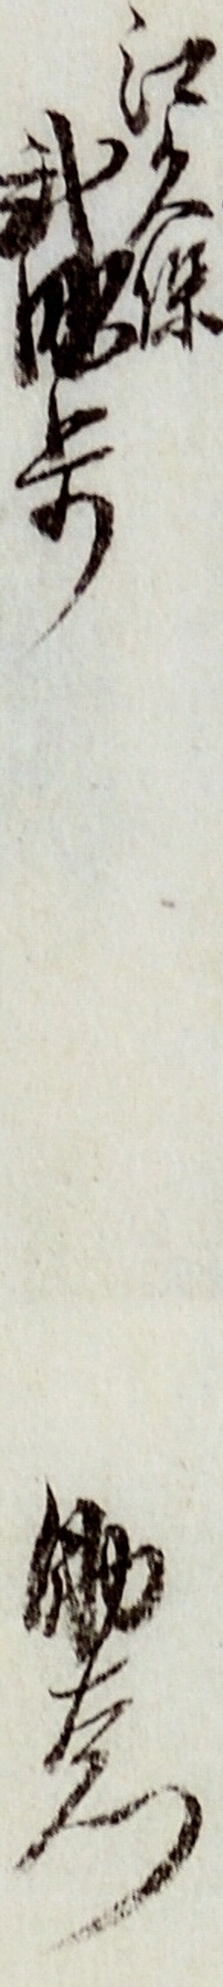弐畝歩助右衛門
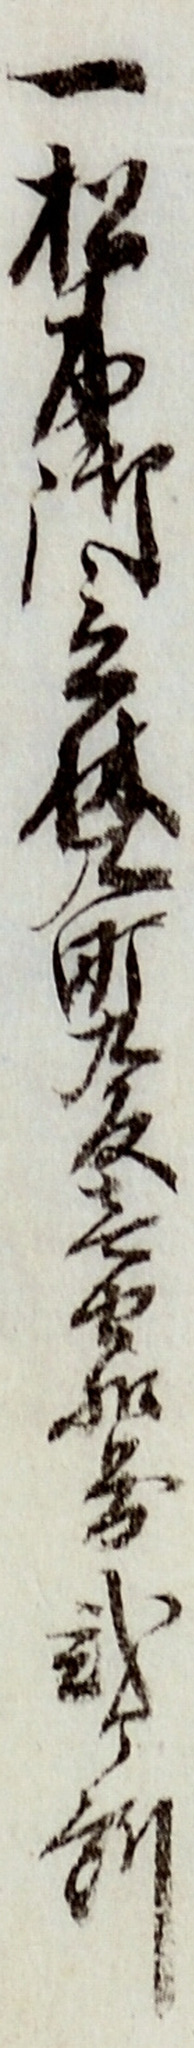一松木御立林九町九反壱セ拾歩弐ヶ所
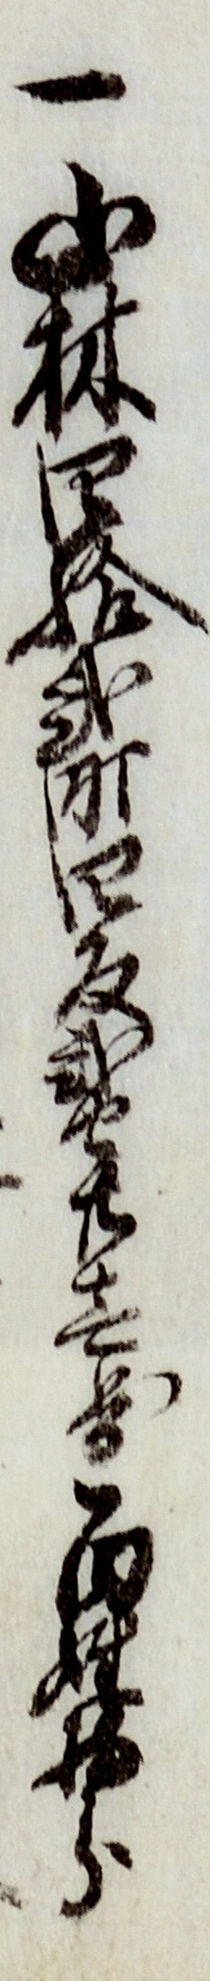一山林四拾弐町四反弐セ廿壱歩百姓持分
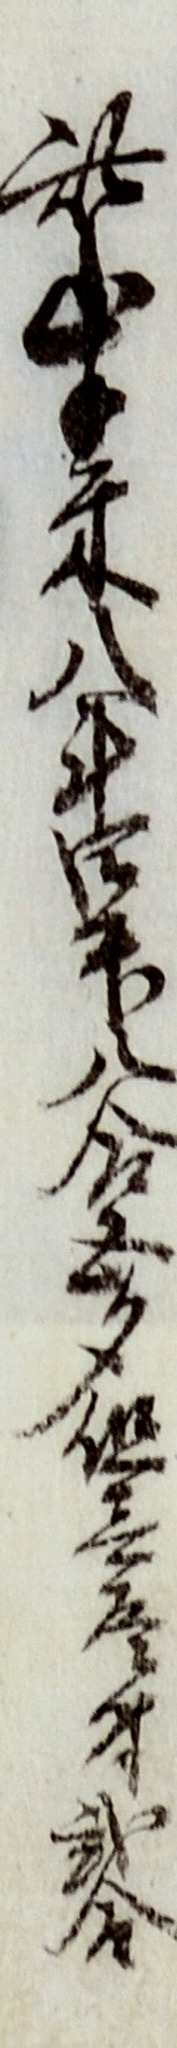此山手米八斗四升八合五勺但壱反ニ付弐合
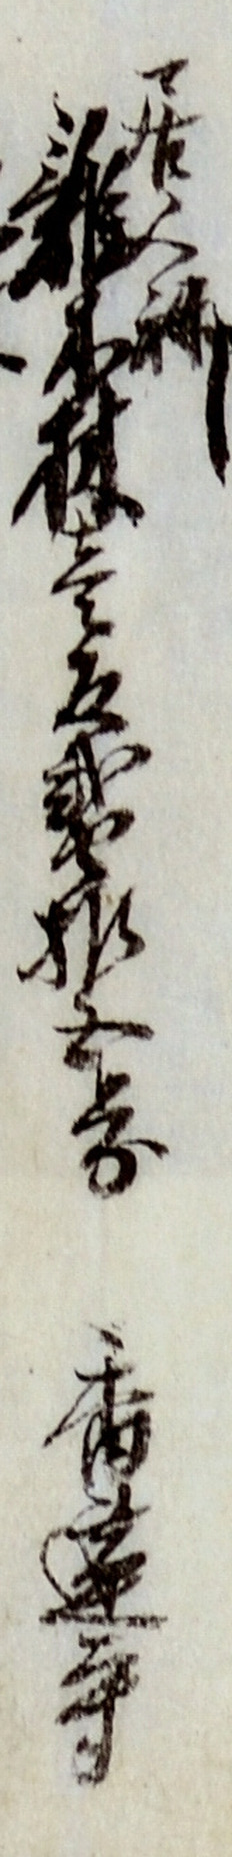雑木林壱反弐セ拾五歩香蓮寺
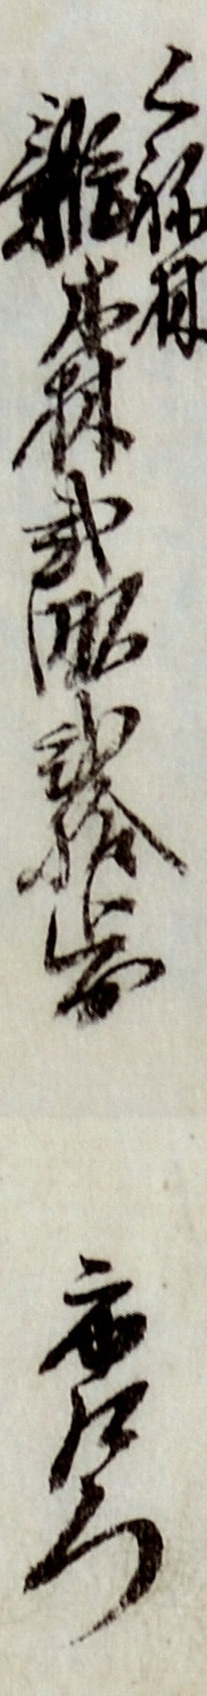雑木林弐畝弐拾歩市左衛門

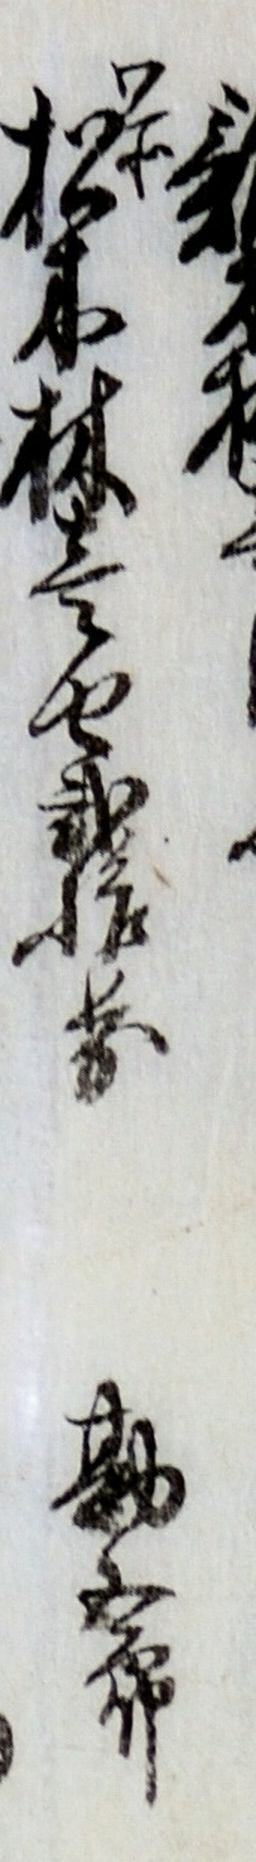松木林壱セ弐拾歩勘五郎
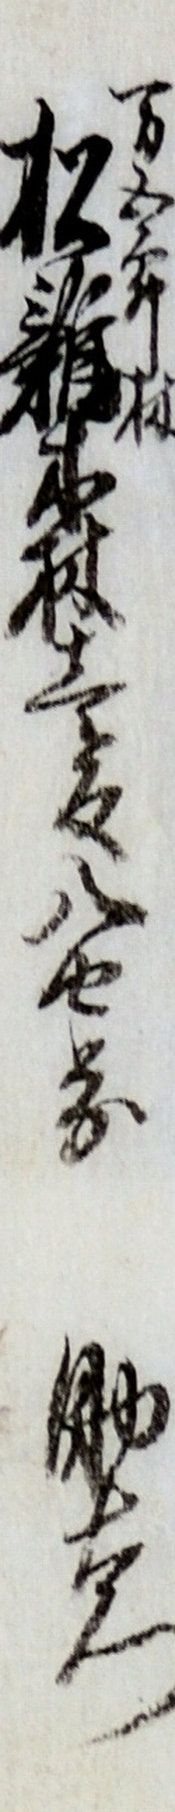松雑木林壱反八セ歩助右衛門
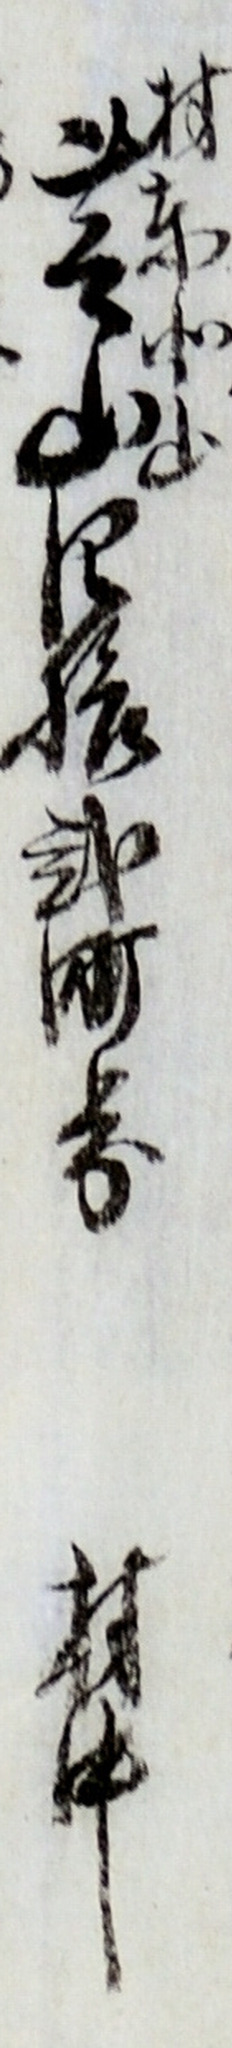芝山四拾弐町歩村中
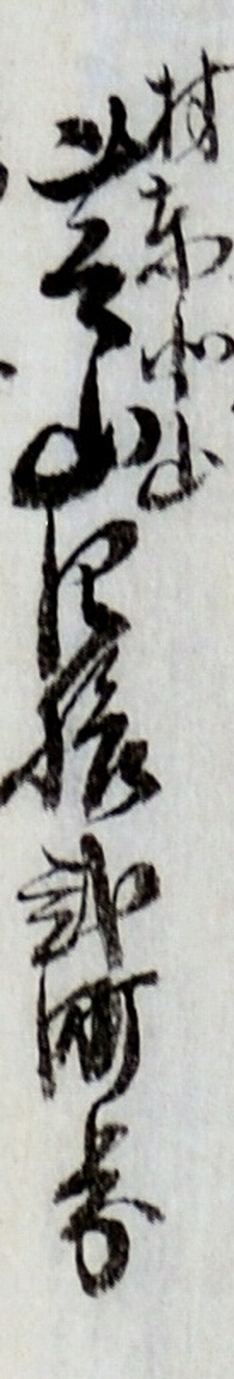芝山四拾弐町歩村中
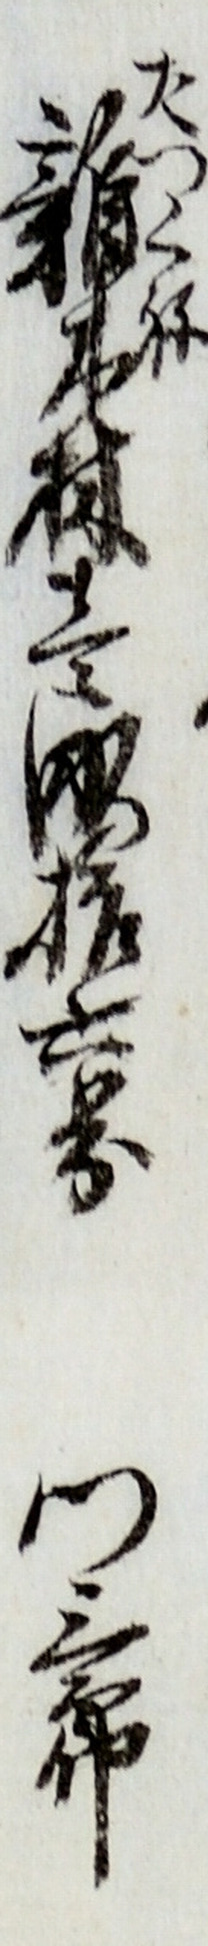雑木林壱畝拾六歩門三郎
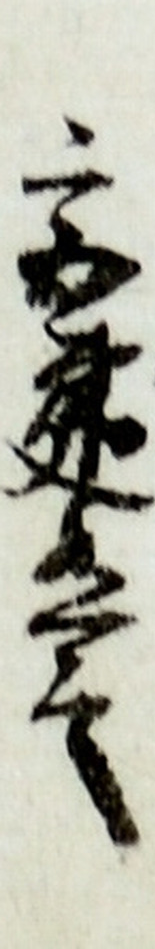宮建有之
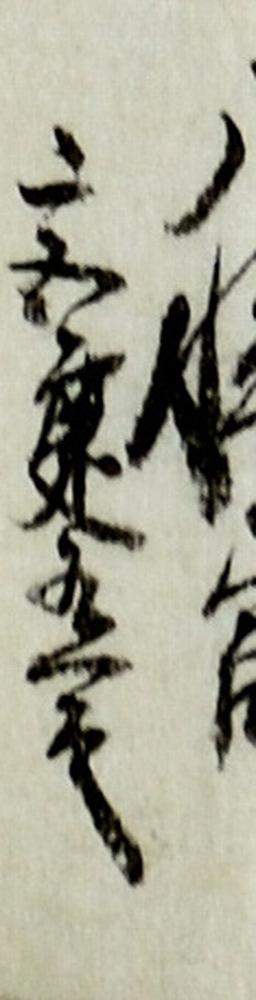宮建有之
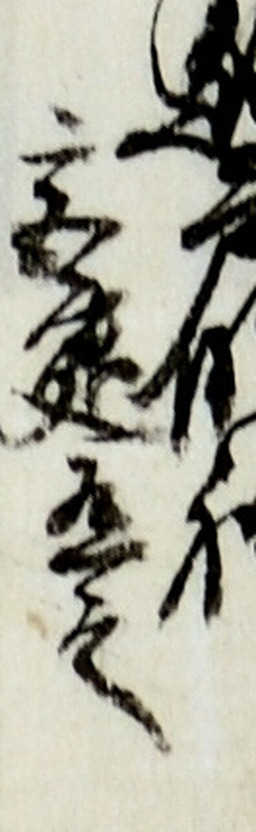宮建有之
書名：御領分中山林社地手控
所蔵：伊那市立高遠町図書館・合同会社AMANE
